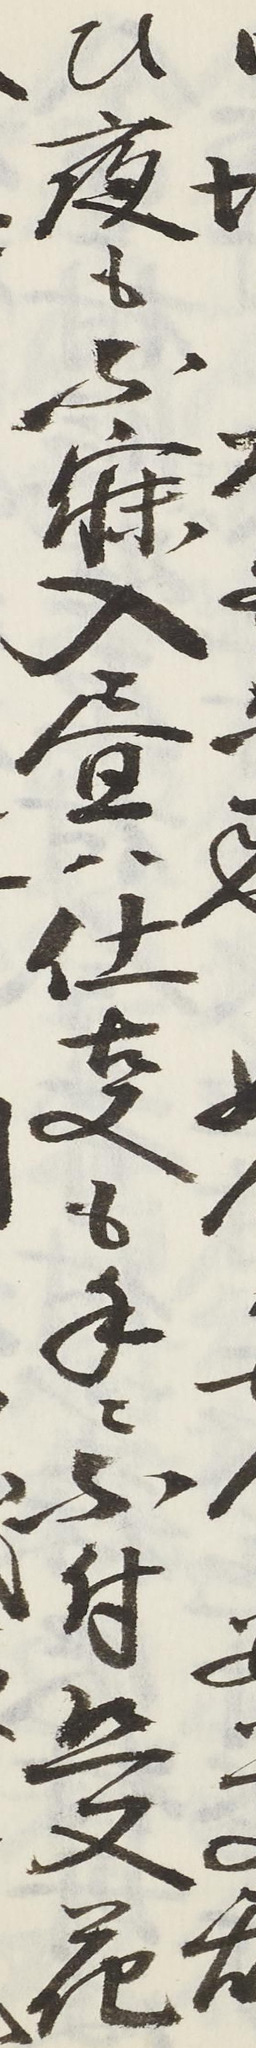ひ夜も不寝入昼ハ仕事も手二不付且又花
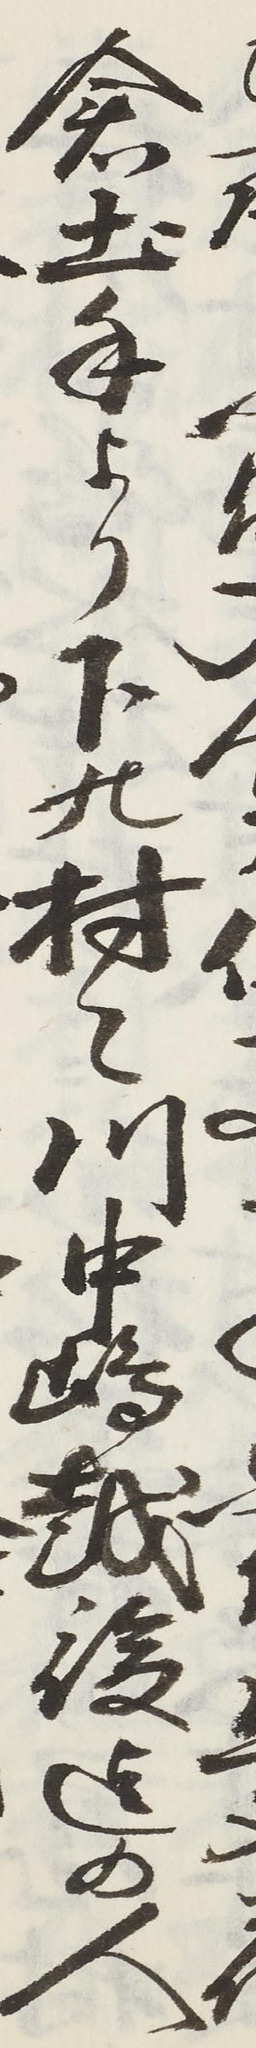倉土手より下の村々川中嶋越後迄の人
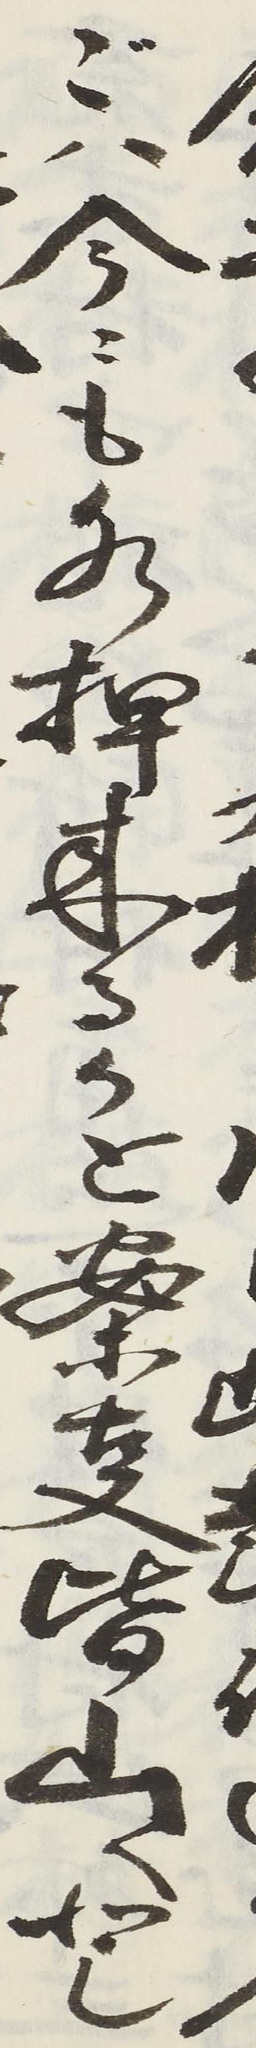々ハ今二も水押来るかと案事皆山へ登
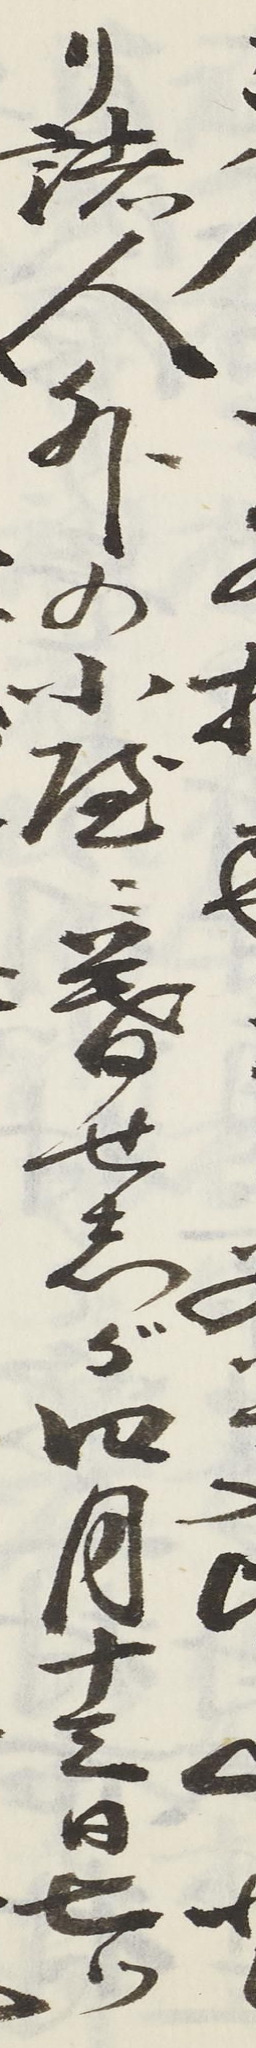り諸人外の小屋二暮せしが四月十三日七ッ
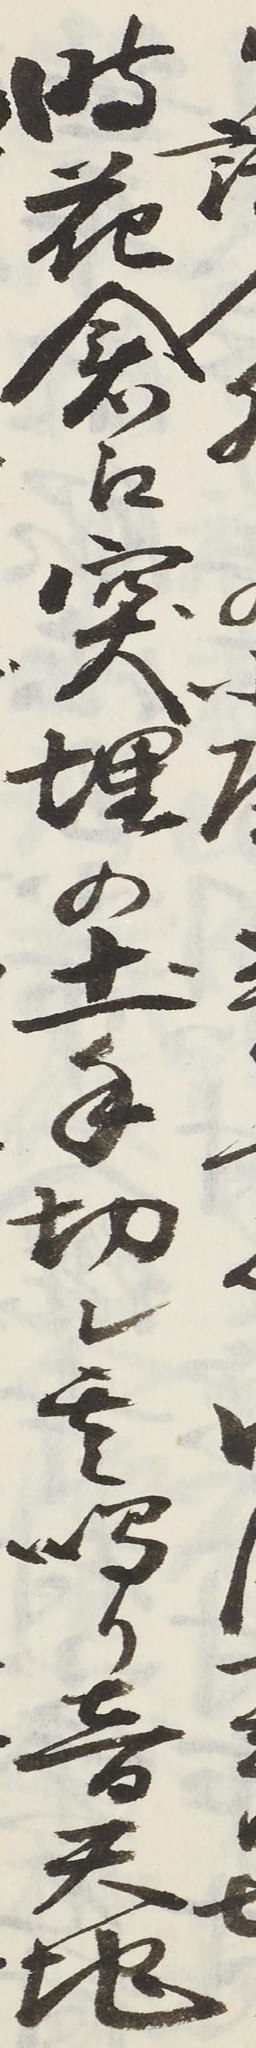時花倉江突埋の土手切ㇾ其鳴り音天地
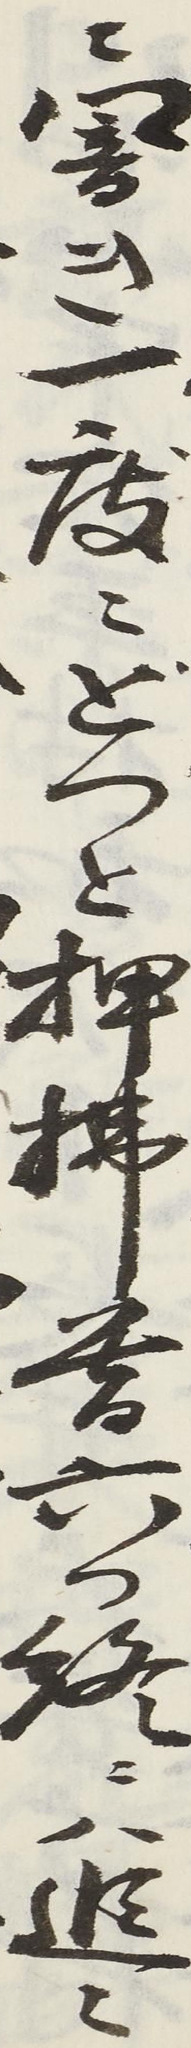二響き一度二どつと押払暮六ッ終二ハ追々
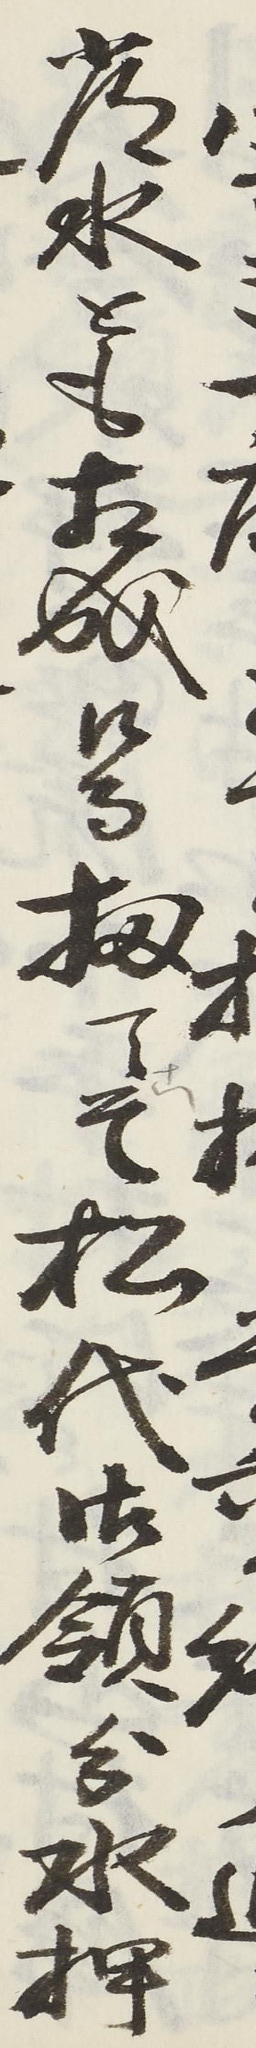常水とも相成ける扨てこそ松代御領分水押
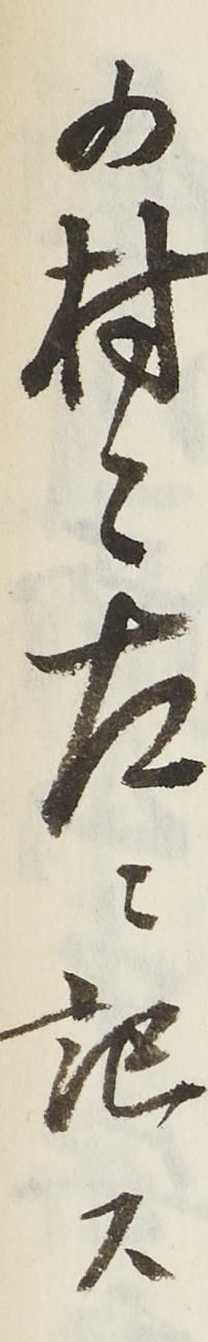の村々左二記ス

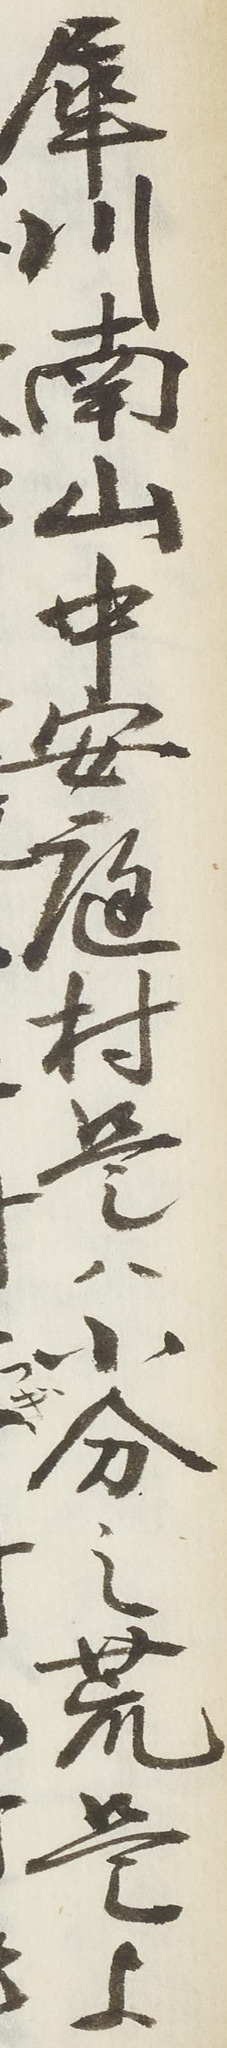犀川南山中安庭村是ハ小分之荒是よ
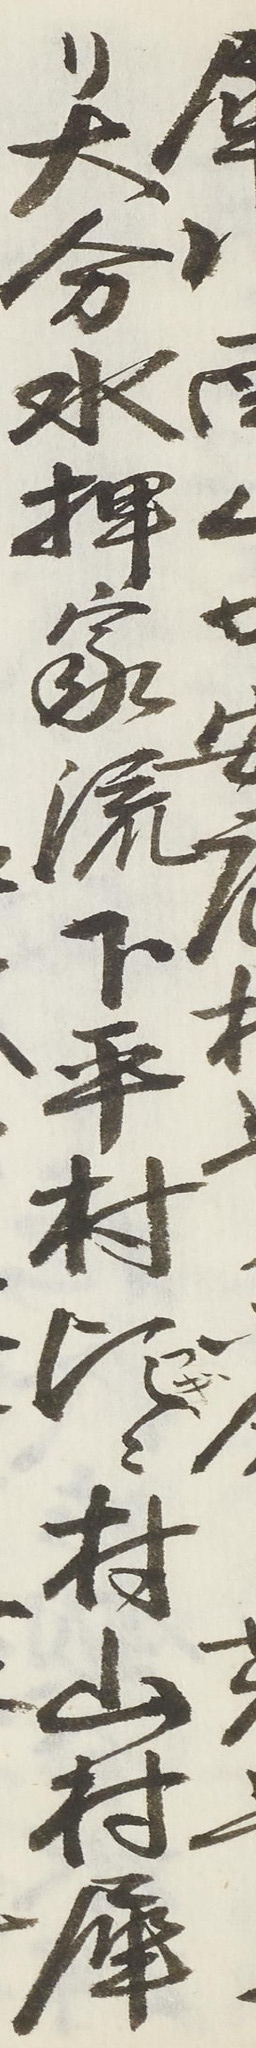り大分水押家流下平村頃二村山犀
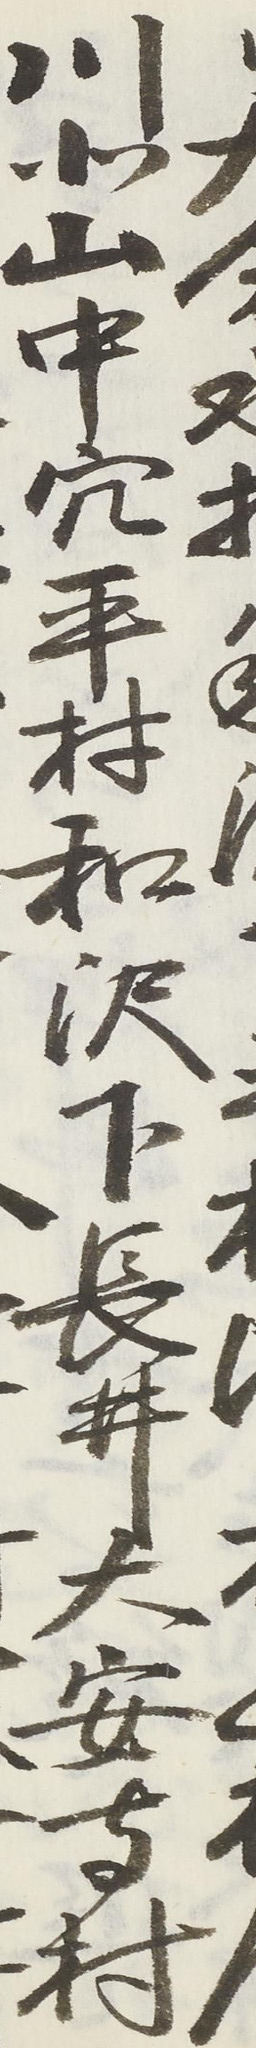川北山中穴平村和沢下長井大安寺村
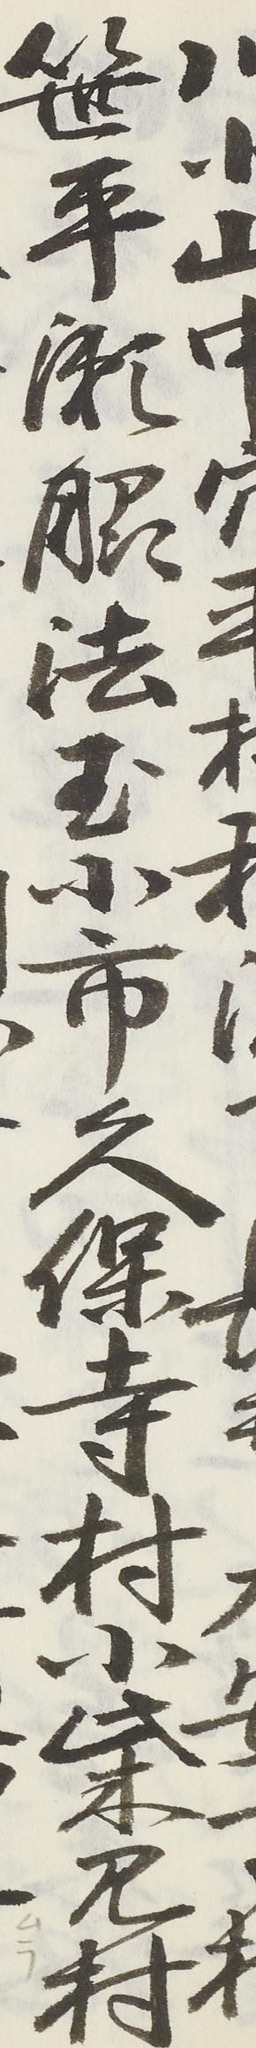笹平瀬脇法玉小市久保寺村小柴見村
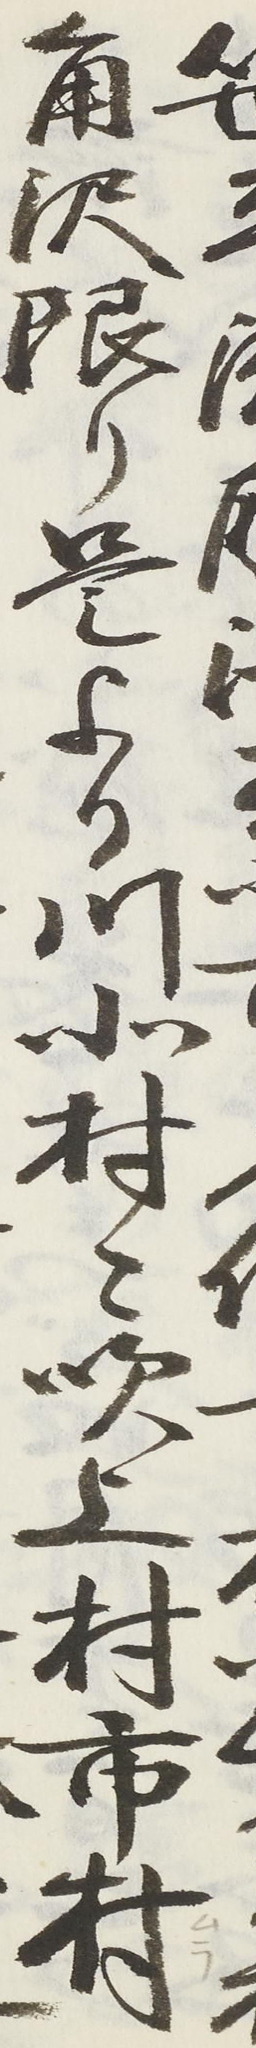角沢限り是より川北村々吹上村市村
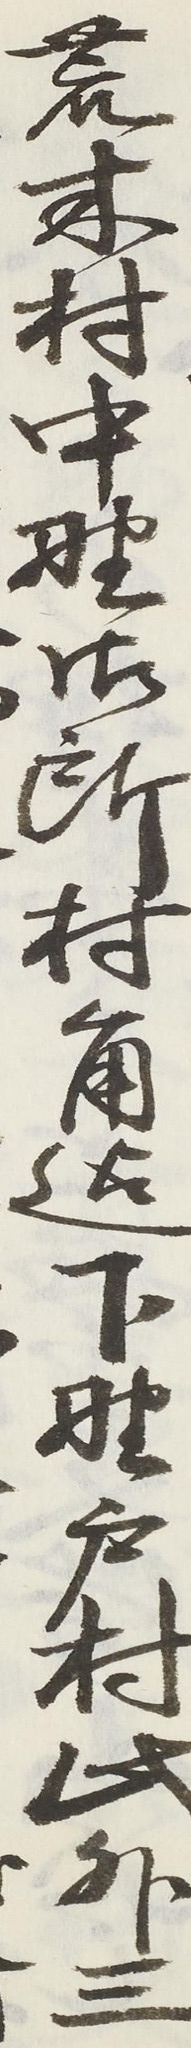荒木村中野御所村角迄下野戸村此外三
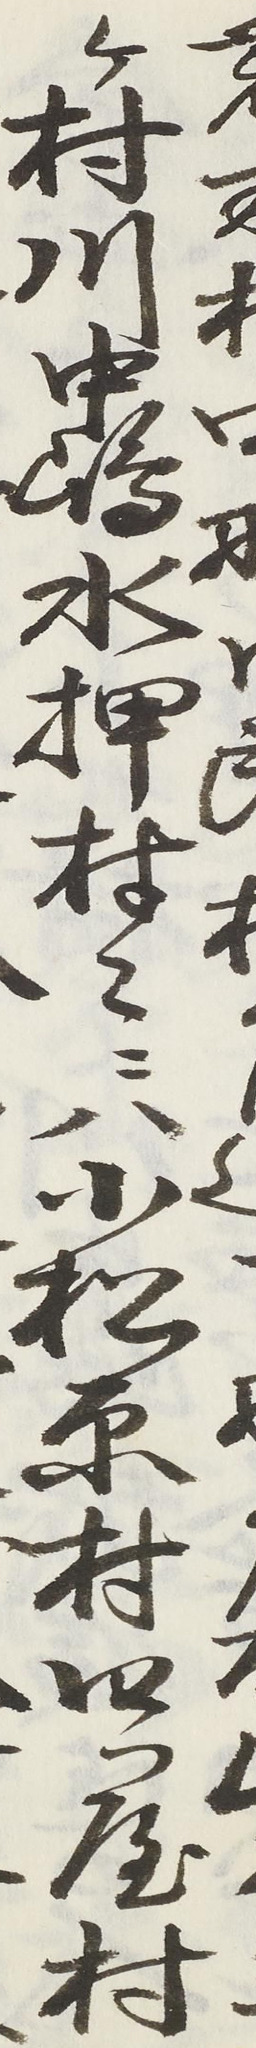ヶ村川中嶋水押村々二ハ小松原村四ッ屋村
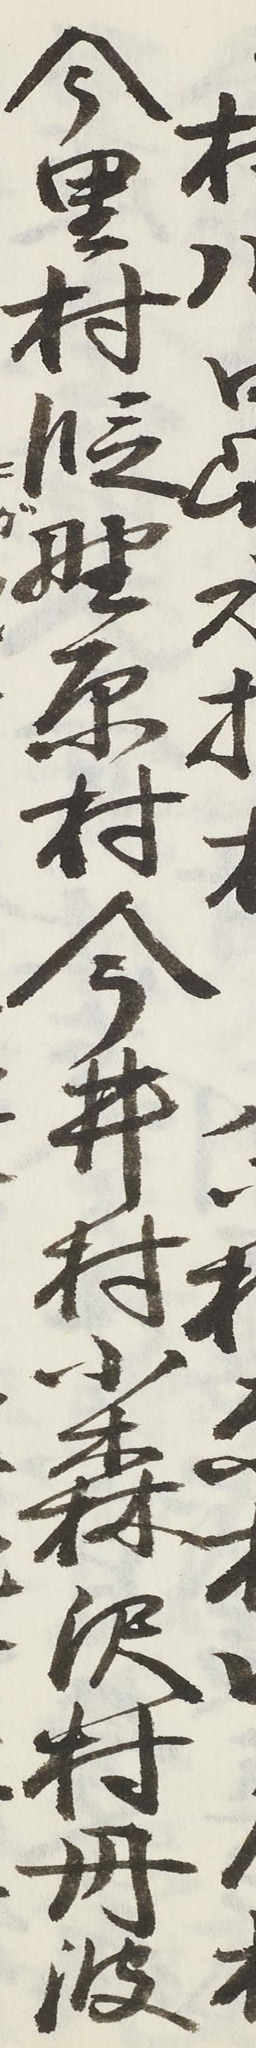今里村段野原村今井村小森沢村丹波
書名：弘化四年地震記
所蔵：東京大学地震研究所図書室 Earthquake Research Institute Library, The University of Tokyo, JAPAN
